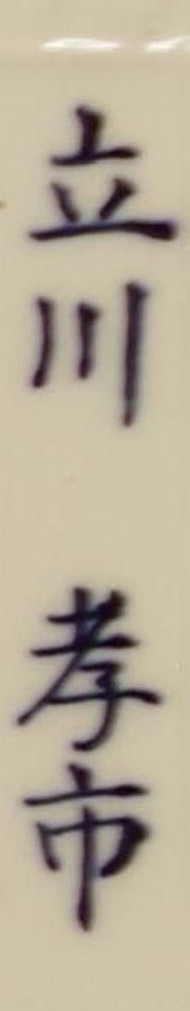立川孝市
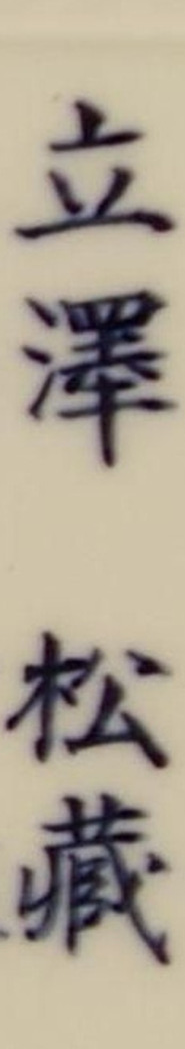立澤松蔵
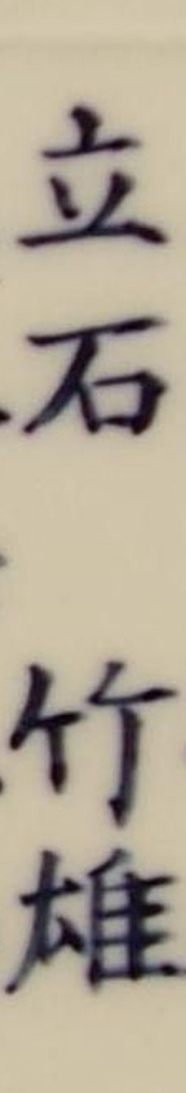立石竹雄
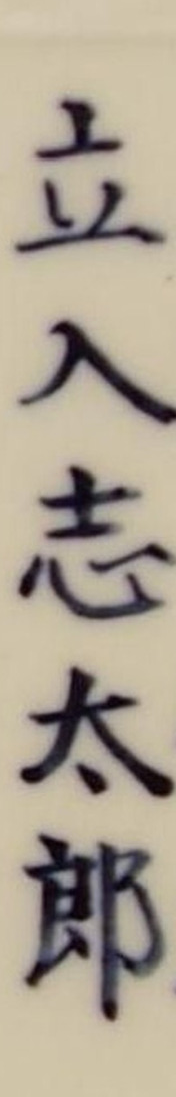立入志太郎
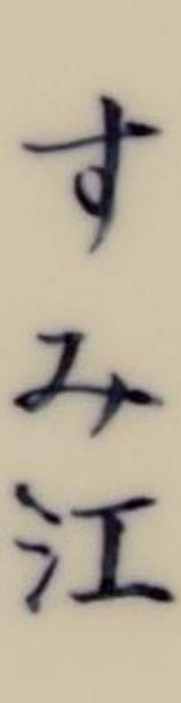すみ江
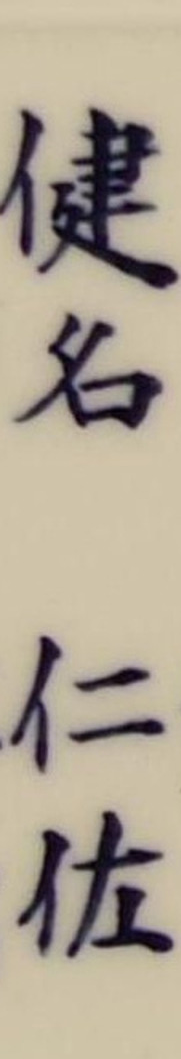健名仁佐
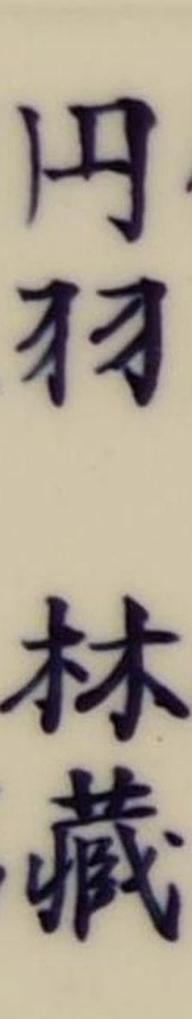円羽林蔵
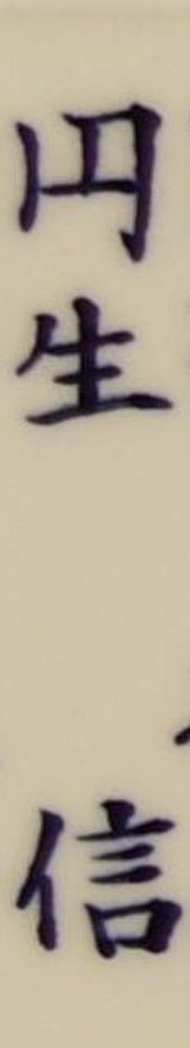円生信
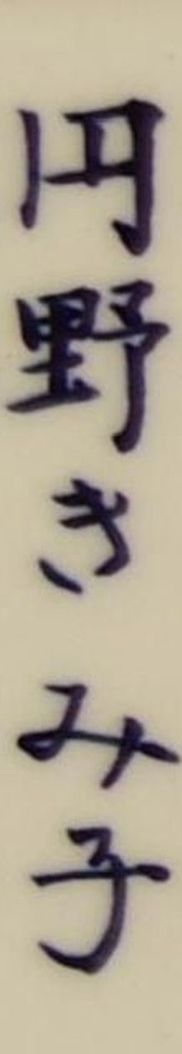円野きみ子
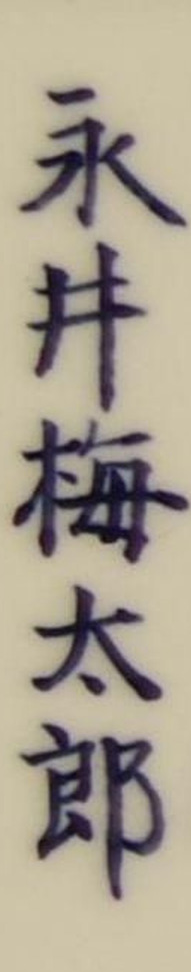永井梅太郎
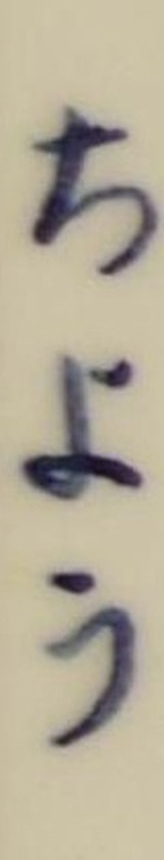ちよう

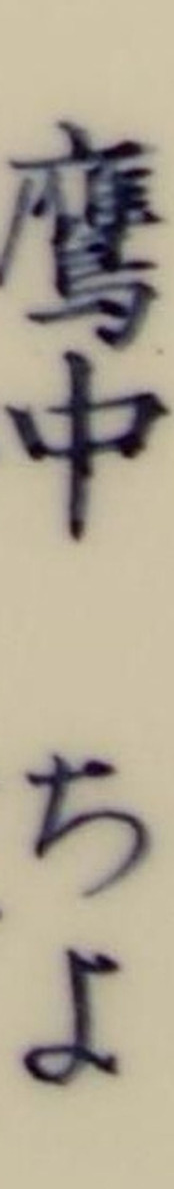鷹中ちよ
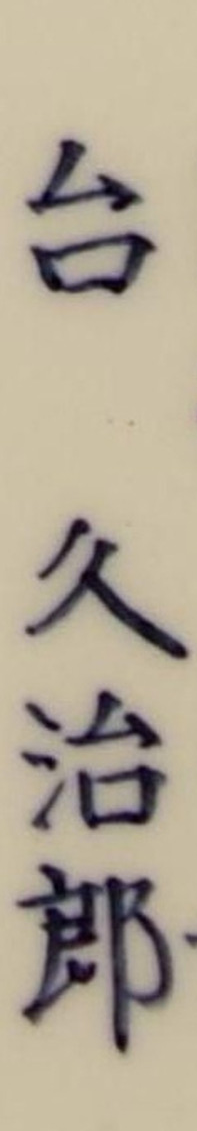台久治郎
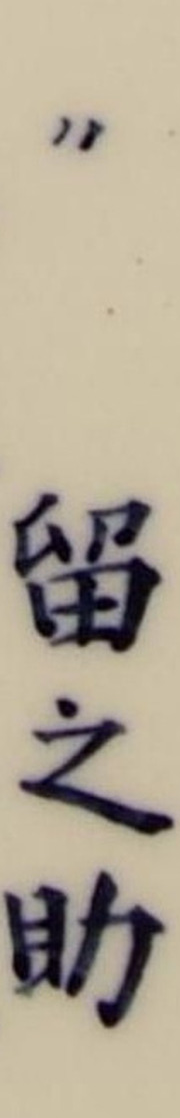留之助
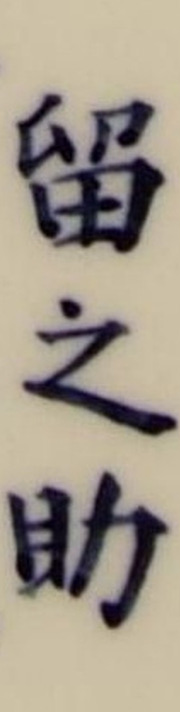留之助
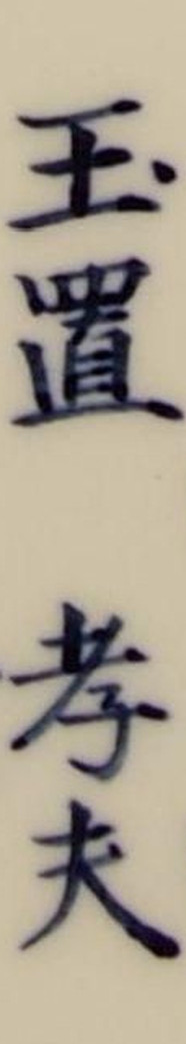玉置孝夫
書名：E~L
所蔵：高野山金剛峯寺
